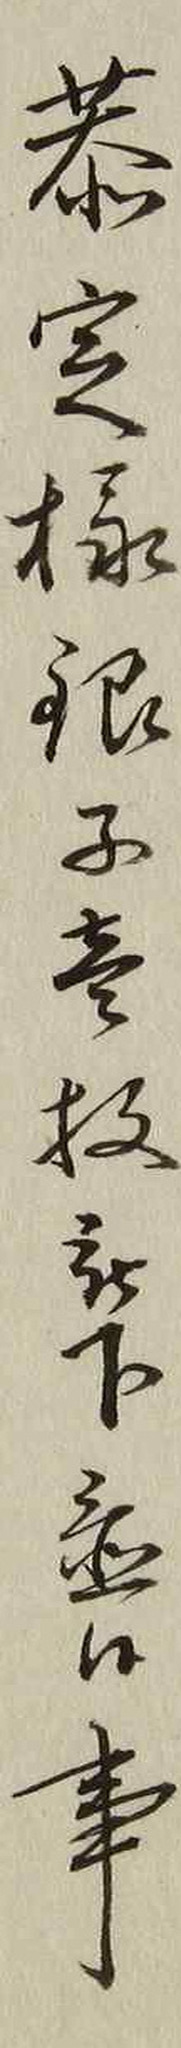恭定様銀子壱枚被下置候事
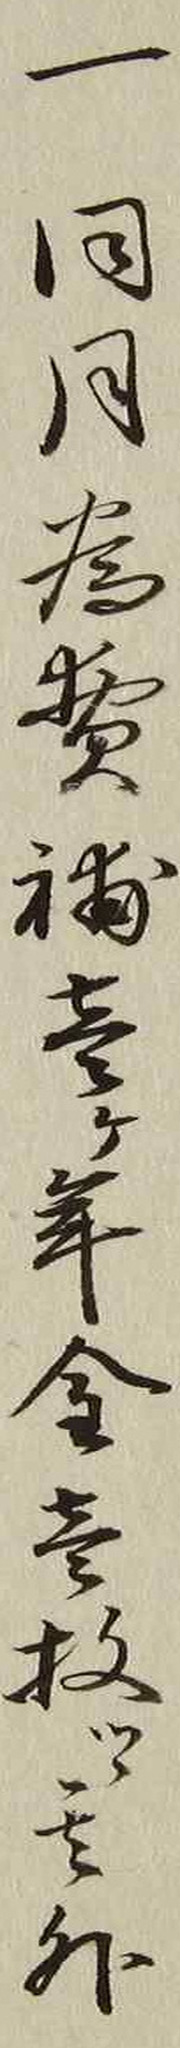一同月為費補壱ケ年金壱枚ツヽ其外
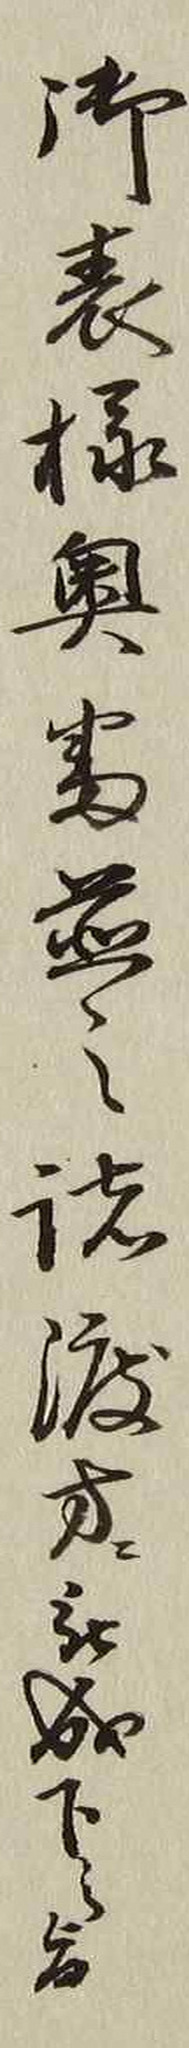御表様奥番並之諸渡方ニ被成下之旨
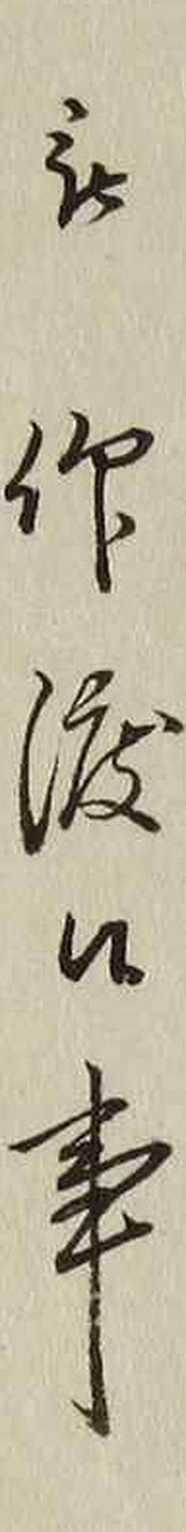被仰渡候事
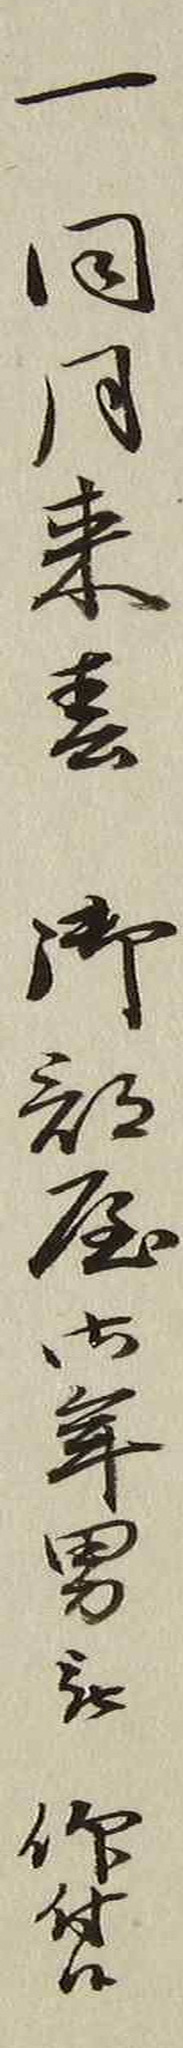一同月来春御部屋御年男被仰付候
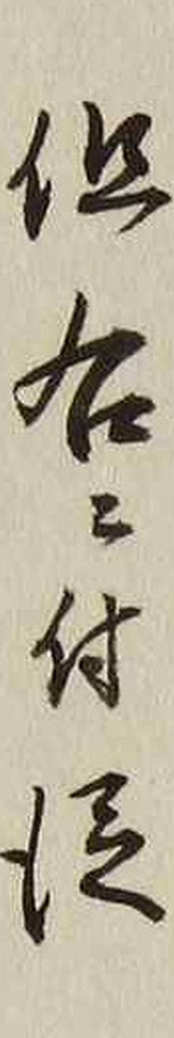但右ニ付従
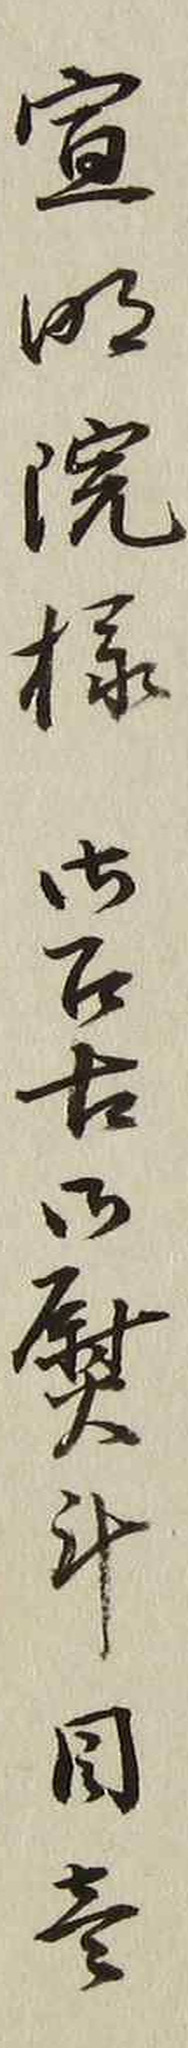宣明院様御召古御熨斗目壱
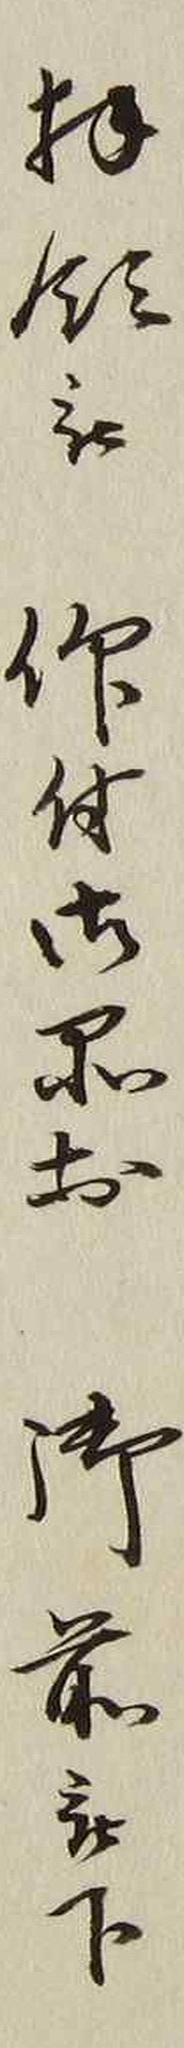拝領被仰付御品於御前被下
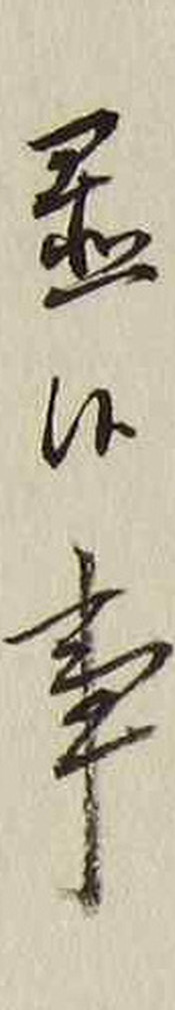置候事
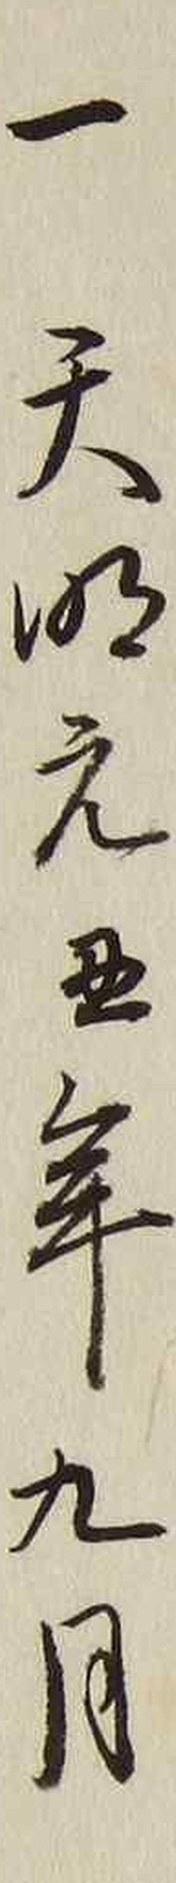一天明元丑年九月
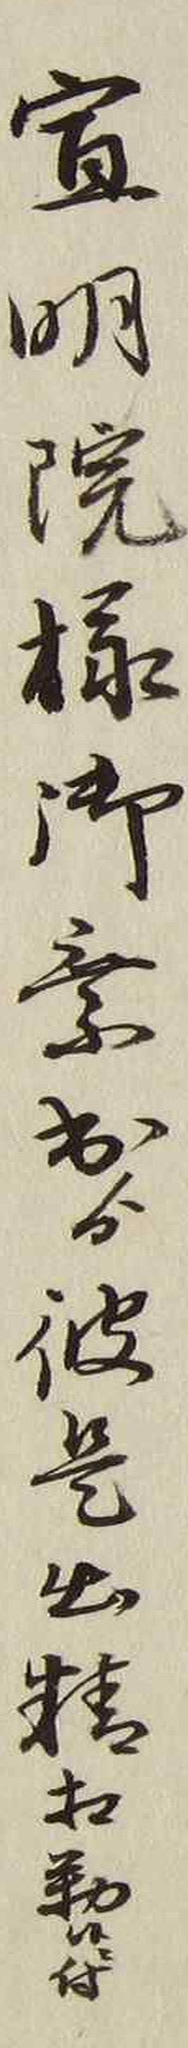宣明院様御乗出ゟ彼是出精相勤候ニ付

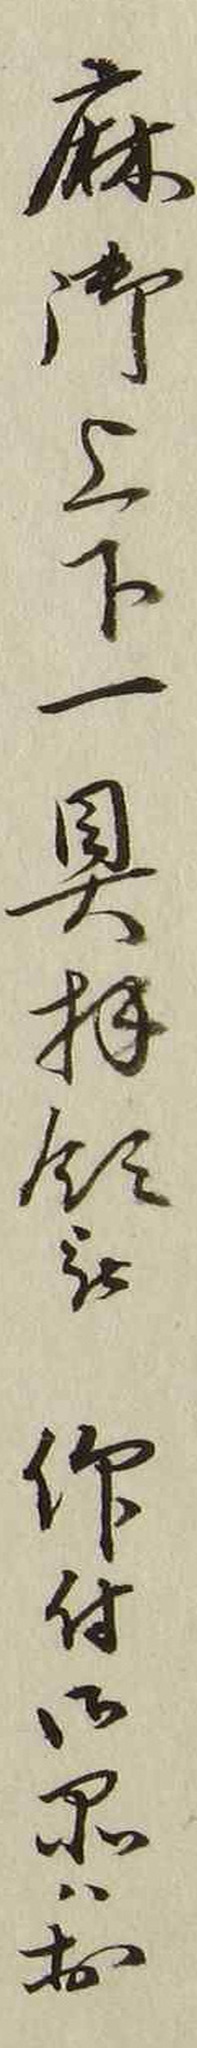麻御上下一具拝領被仰付御品ハ於
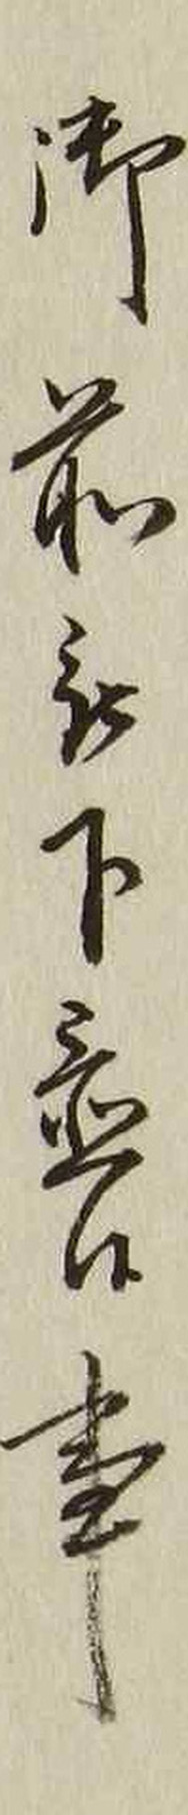御前被下置候事
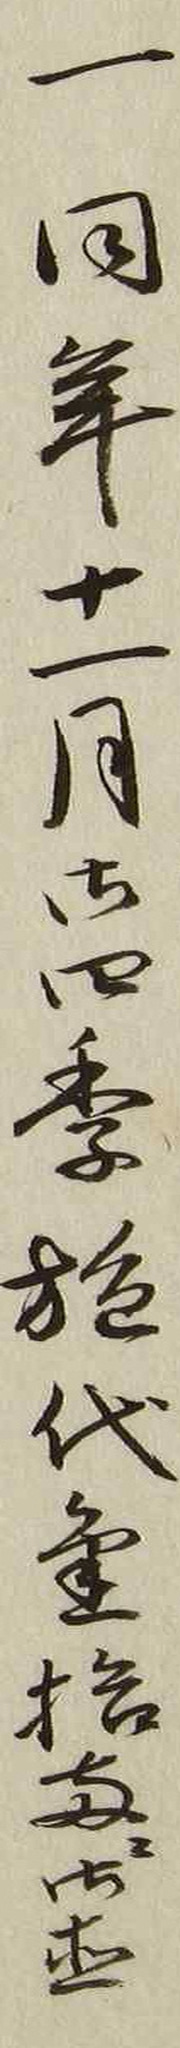一同年十一月御四季施代金十両ニ御直
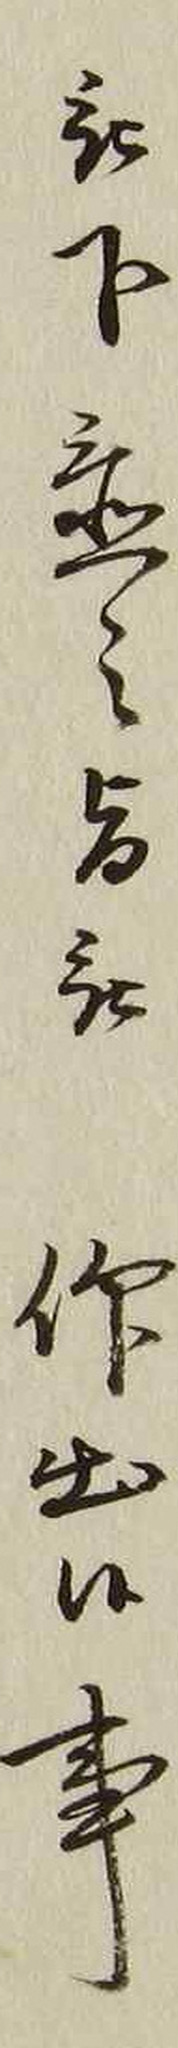被下置之旨被仰出候事
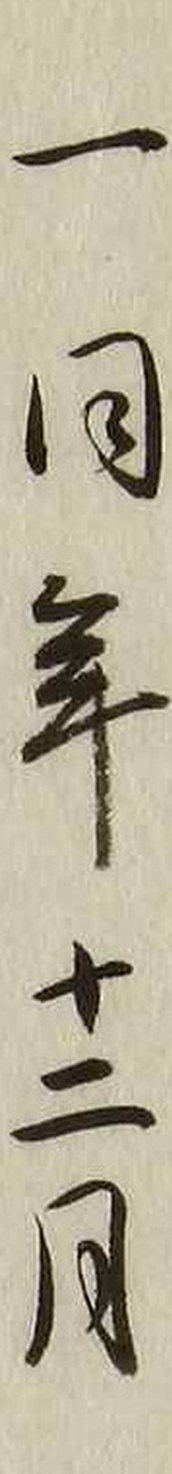一同年十二月
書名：諸士系譜　巻之160　な之部2
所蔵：会津若松市立会津図書館
